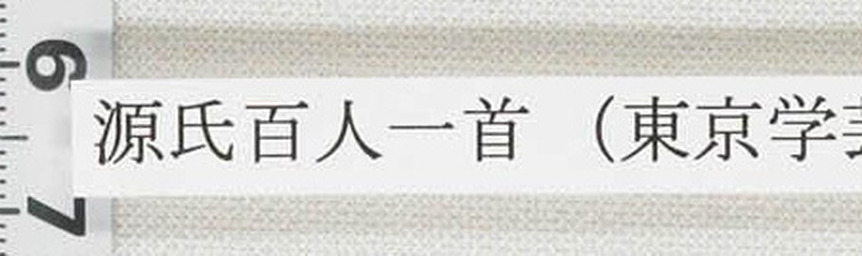源氏百人一首完
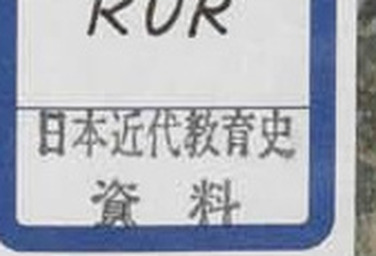日本近代教育史
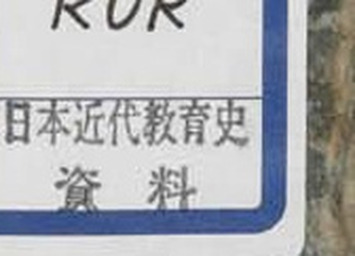日本近代教育史

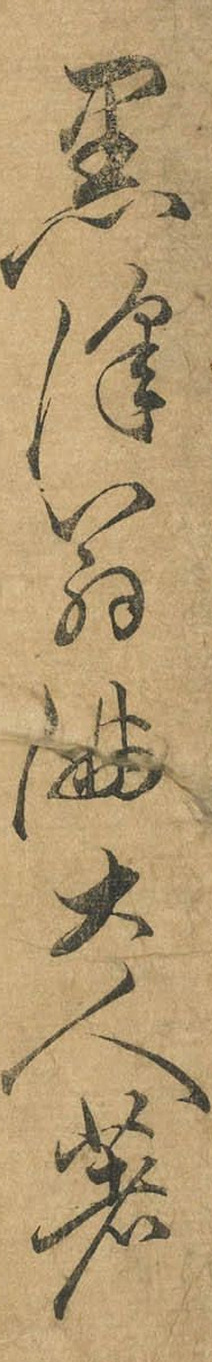黒沢翁満大人著
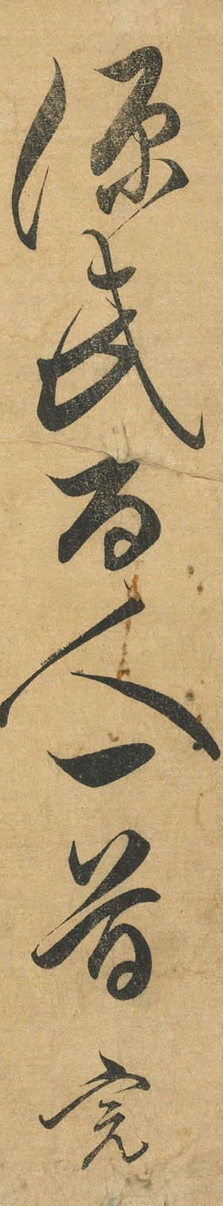源氏百人一首完
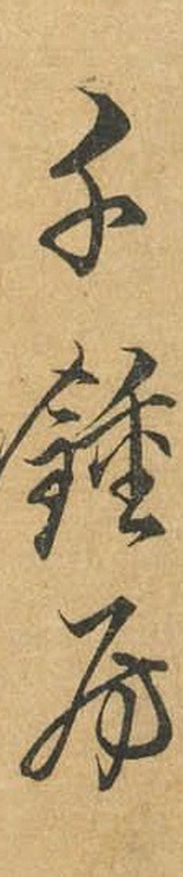千鐘房
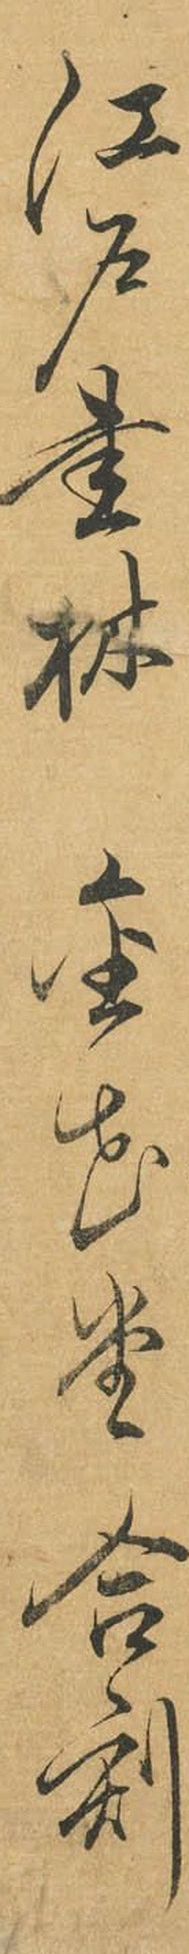江戸書林金花堂合刻
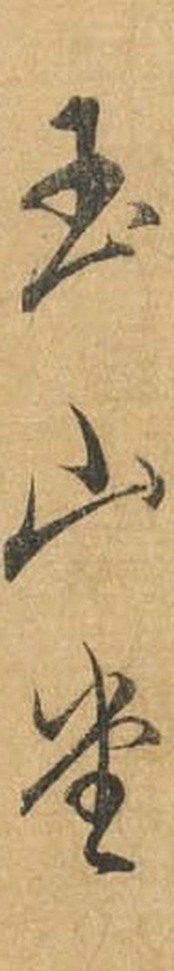玉山堂
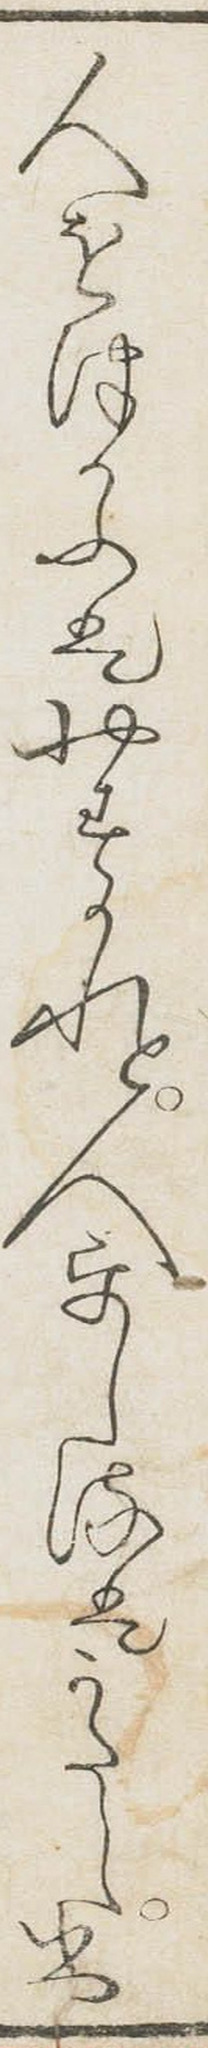人をつかふはやすかれと。人をしるはかたし。書
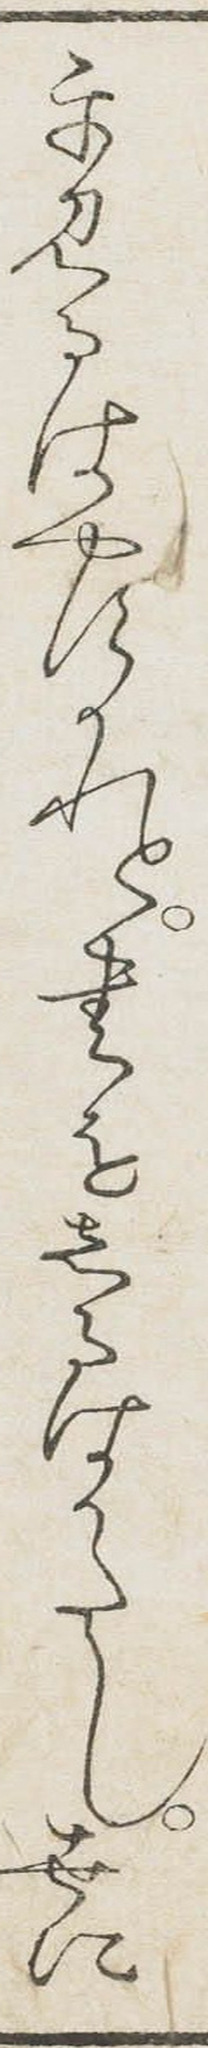を見るはやすけれと。書をしるはかたし。世に
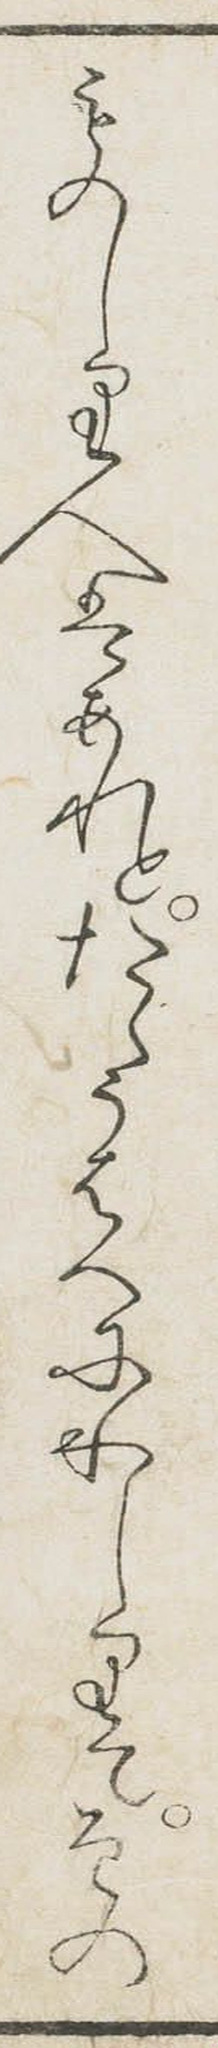ものしり人はあれと。たゝうはへにわしりて。その
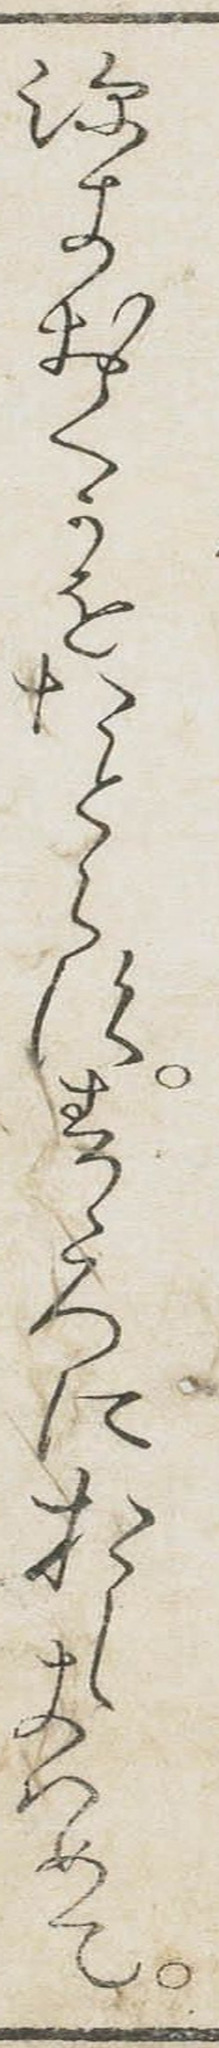深きおくかをたとらす。すゝろにおしきはめて。
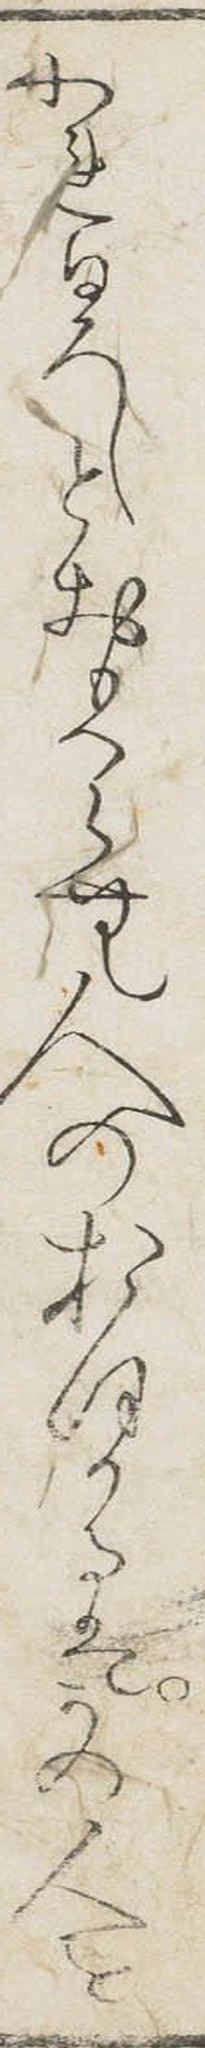われひろしとおもへらむ人のおほかるは。かの人を
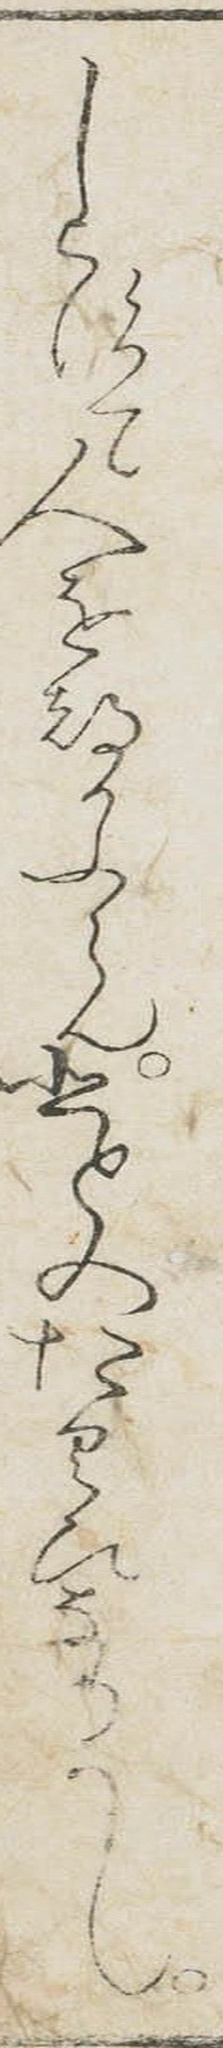しらすて人をつかふらん。ひとのたくひなりかし。
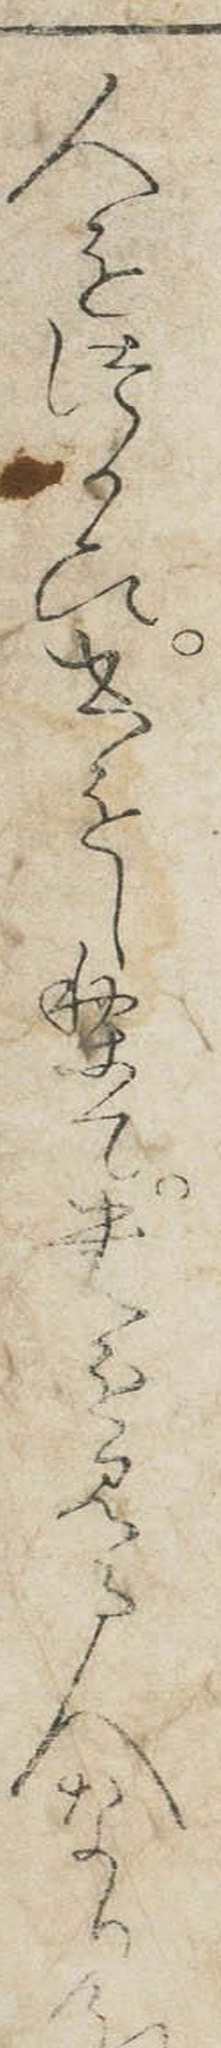人をつかひ。書をしりて。書を見る人なりけれ

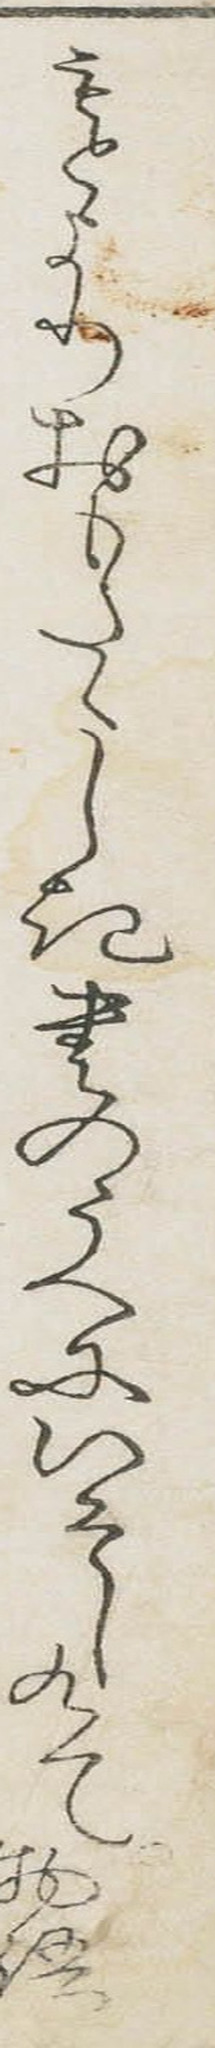もとよりおもたゝしき書のうへにいそしくて物語
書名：源氏百人一首
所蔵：東京学芸大学教育コンテンツアーカイブ
